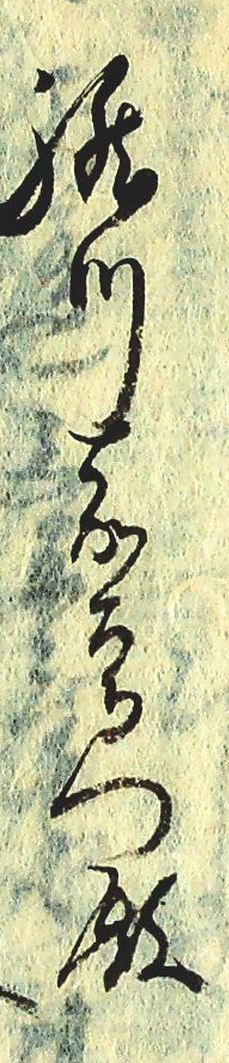瀧川嘉右衛門殿
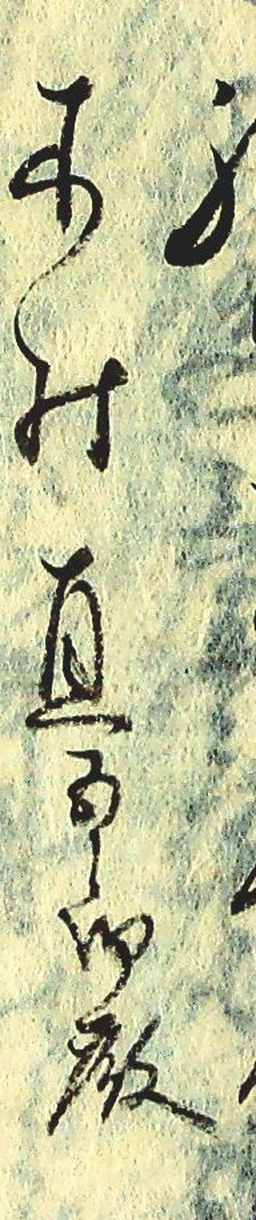木村直五郎殿

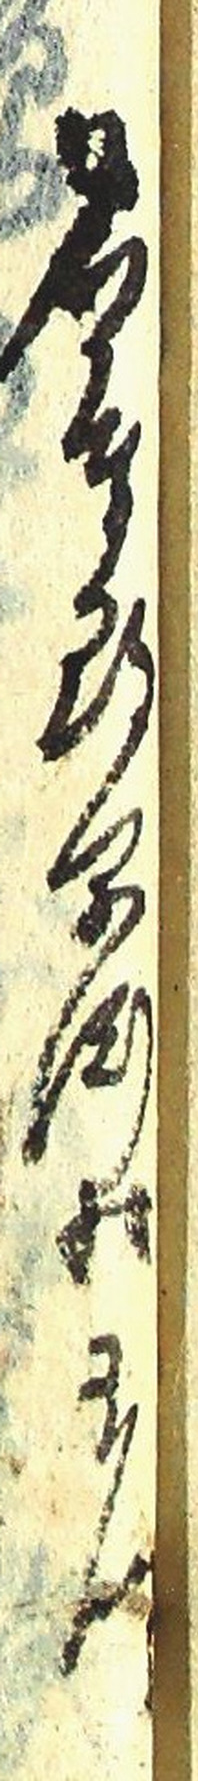名東郡早淵村玉師
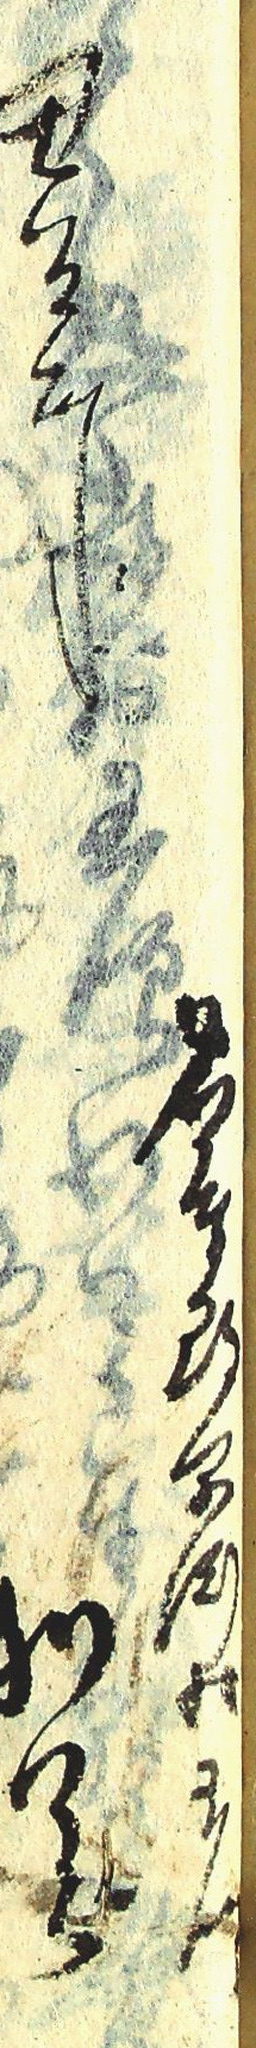丑閏正月利八郎
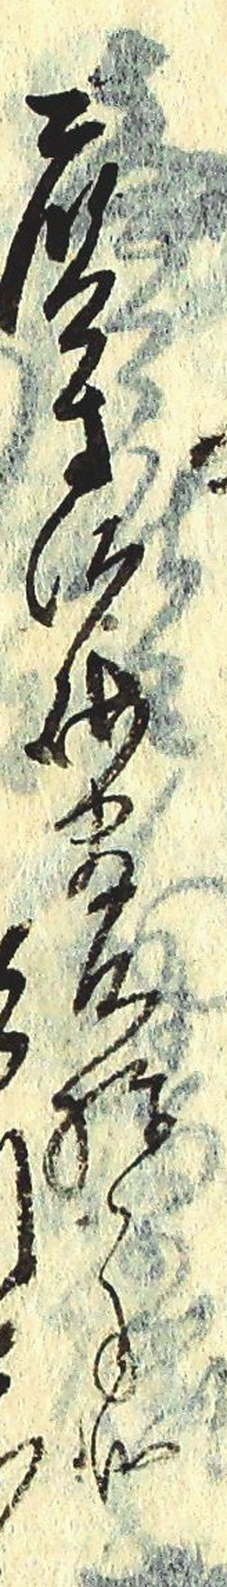藍方御代官所様御手代
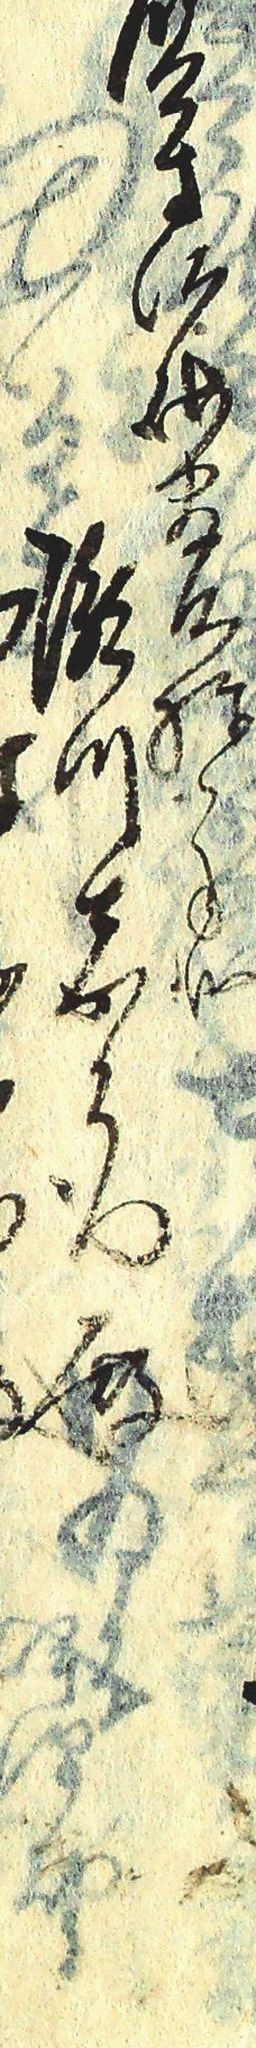紙川嘉右衛門殿
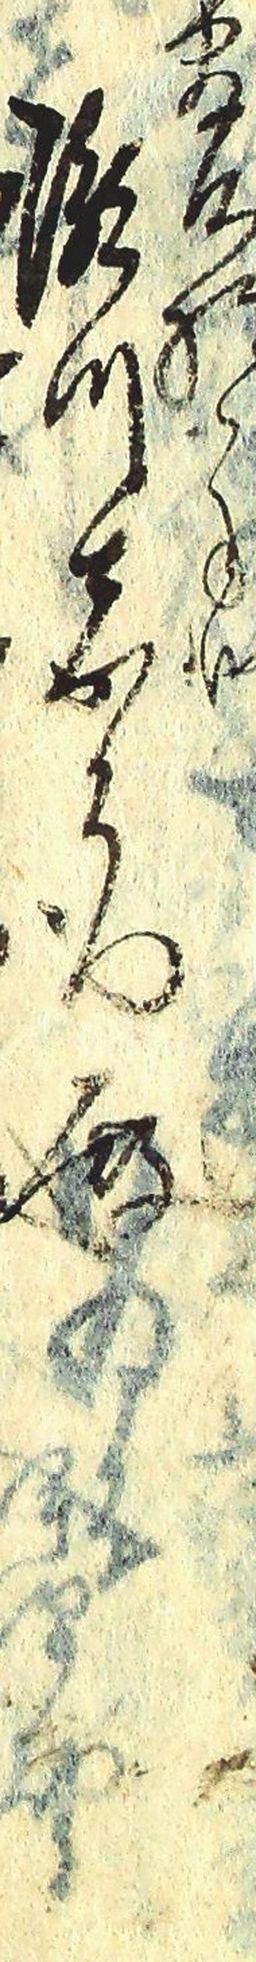紙川嘉右衛門殿
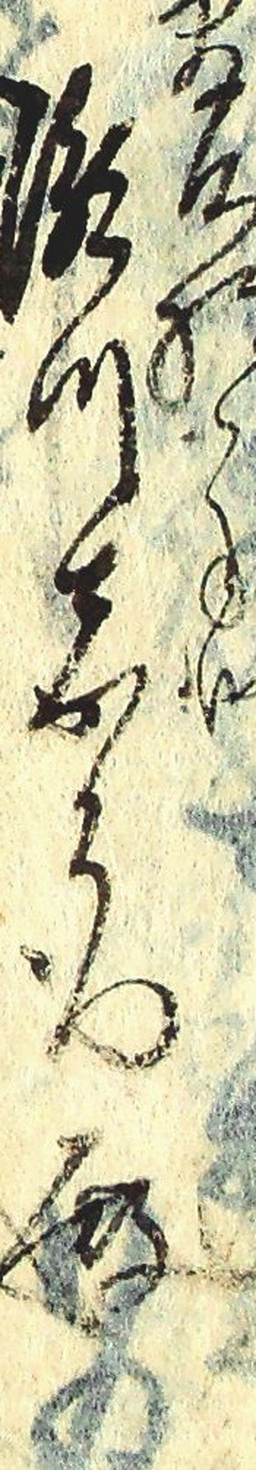紙川嘉右衛門殿
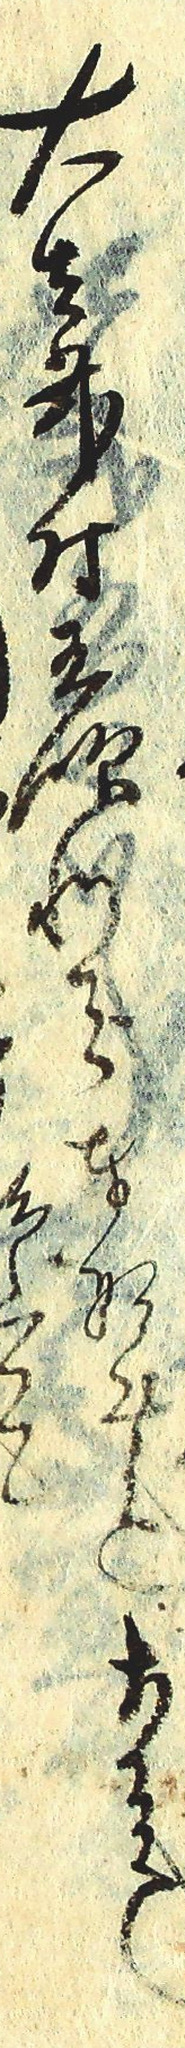右は当村玉師利八郎奉願上通相違
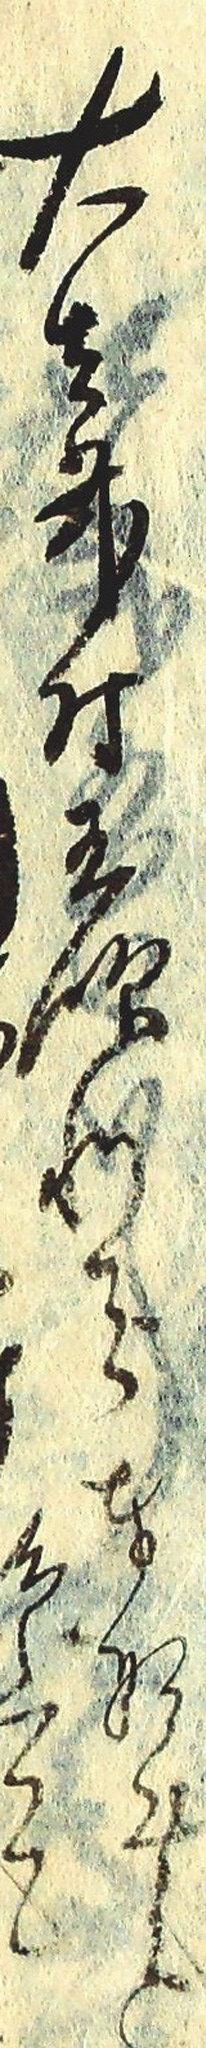右は当村玉師利八郎奉願上通相違
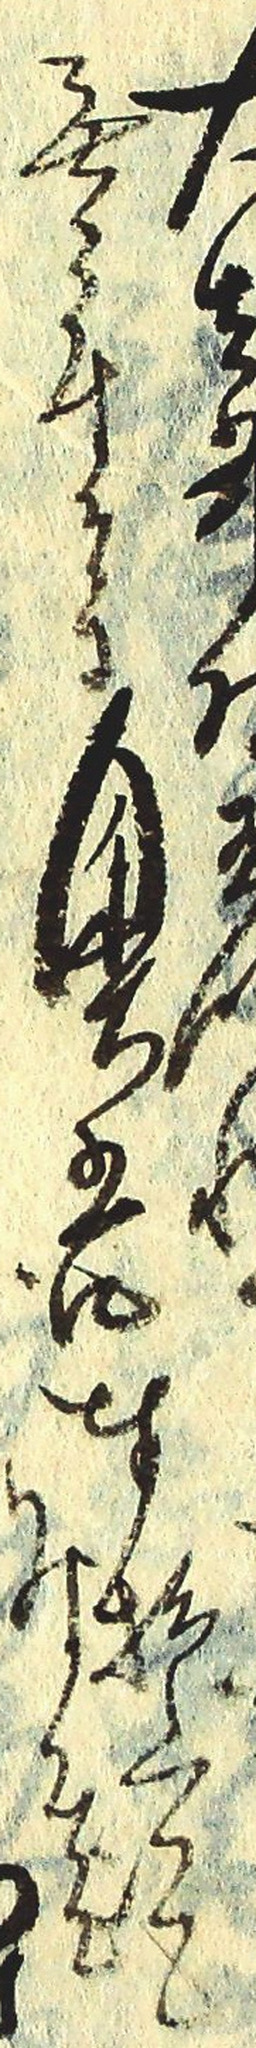無御座候に付奥書仕奉指上候以上
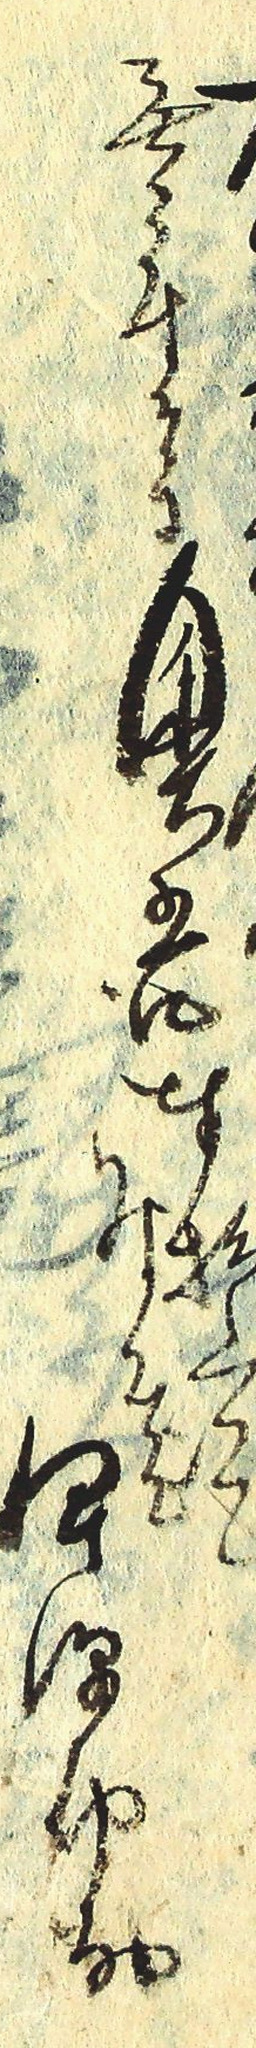無御座候に付奥書仕奉指上候以上
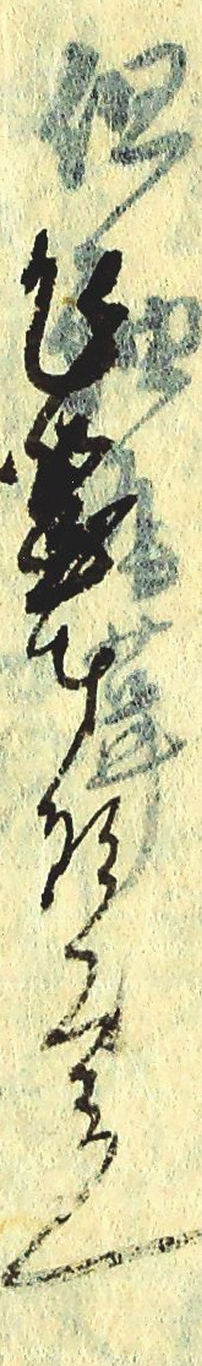乍恐奉願上覚
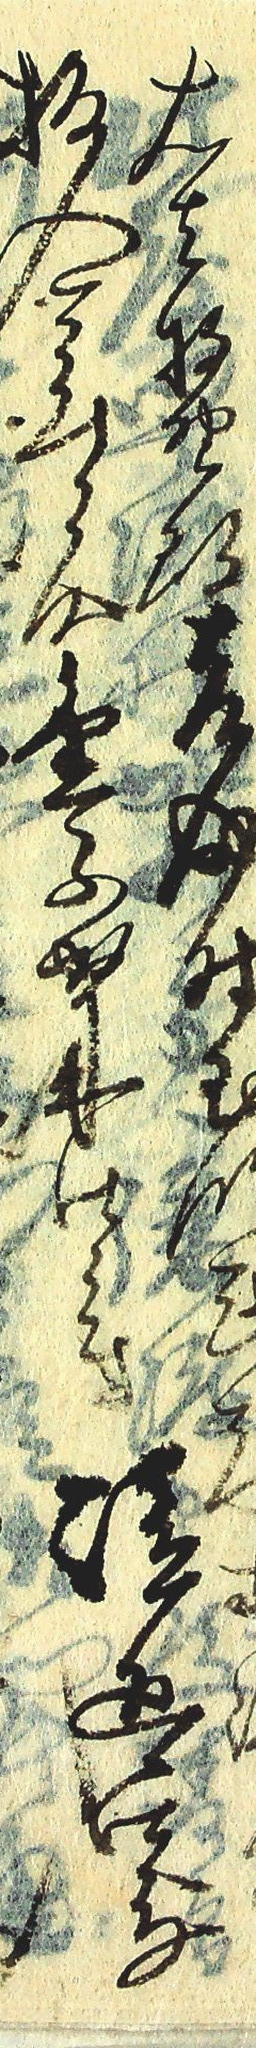指入御座候所金子出来仕候付請返し仕度
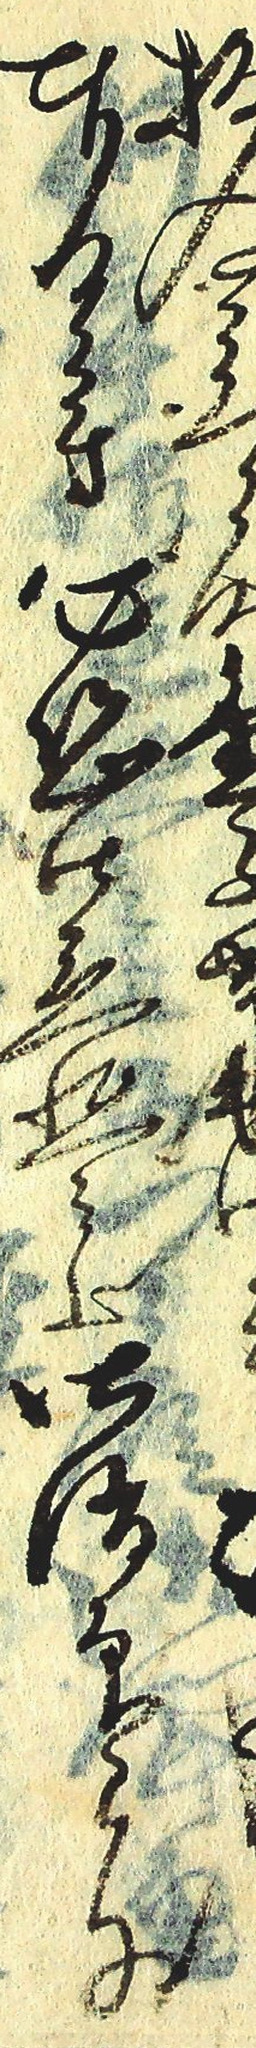奉存候付乍恐御慈悲之上御消印被為
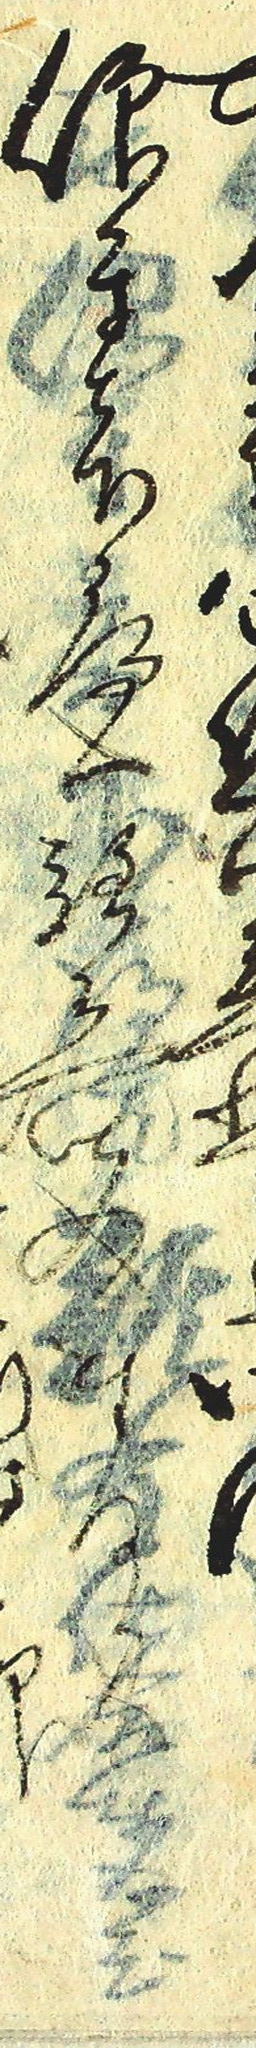仰付被下候得は難有仕合に奉存候以上
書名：諸御願書控(弐番）
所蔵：鳴門教育大学 Naruto University of Education
